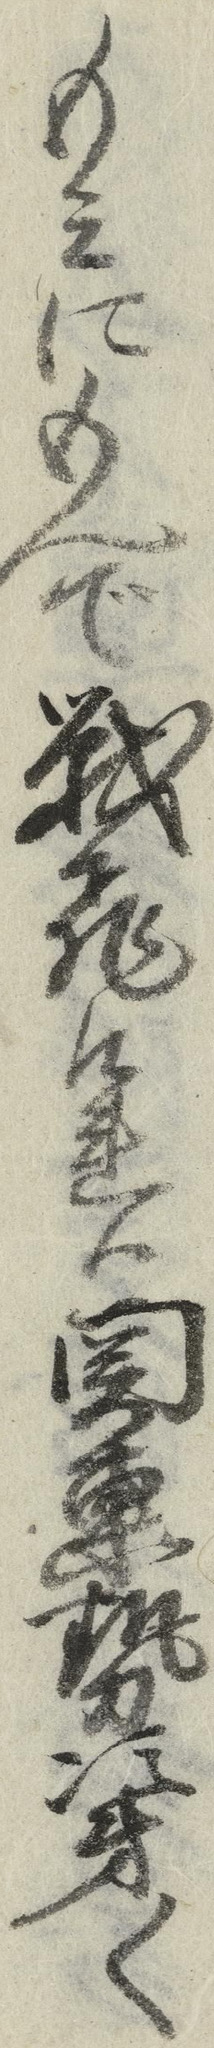もみにもんで戦ひけれは関東勢次第〳〵
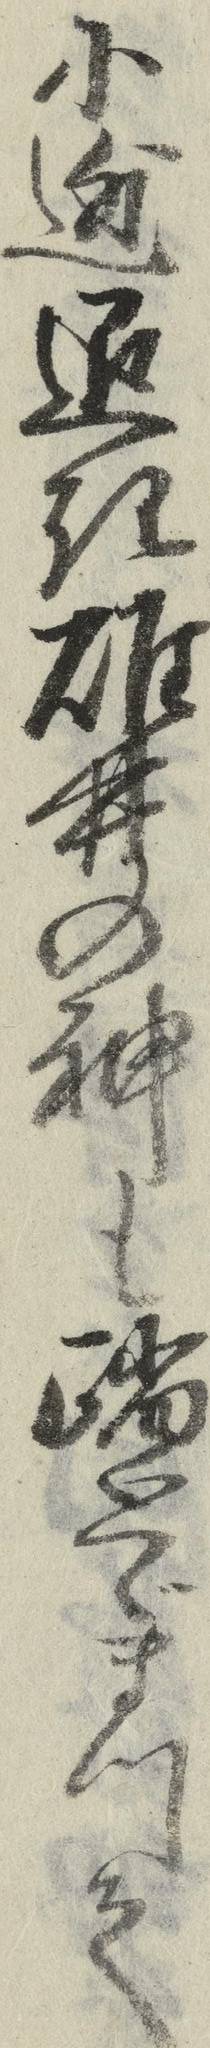に迯退き碓井の神も蹈とゞまつて
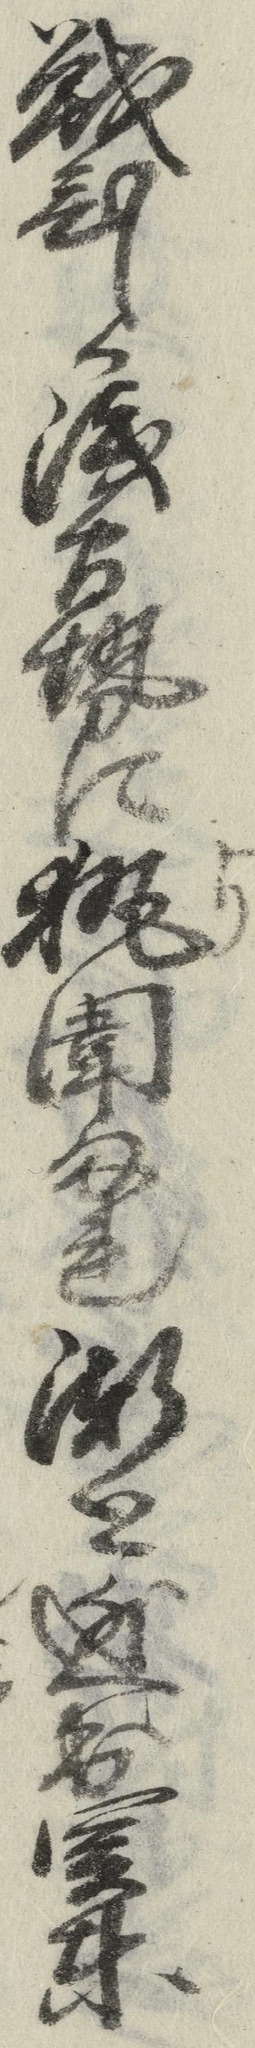戦ひしか浅間勢に執圍まれ漸と迯出関東
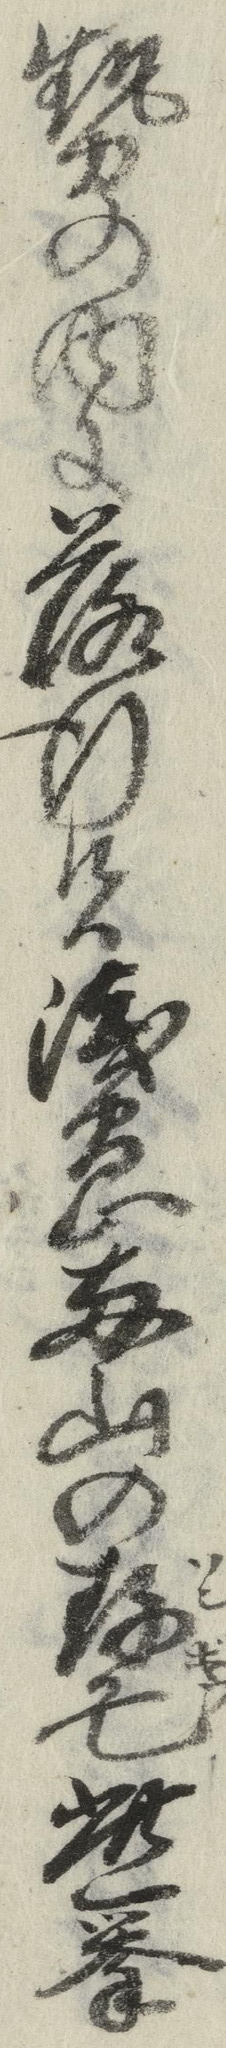勢の内に落行ける浅間山両山の存亡此一挙
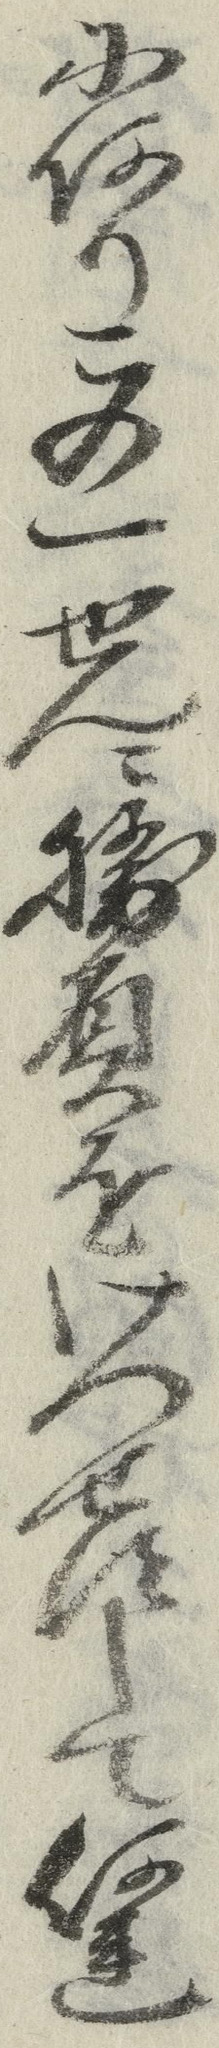にありこの一せんに勝負をけつせすして何れ
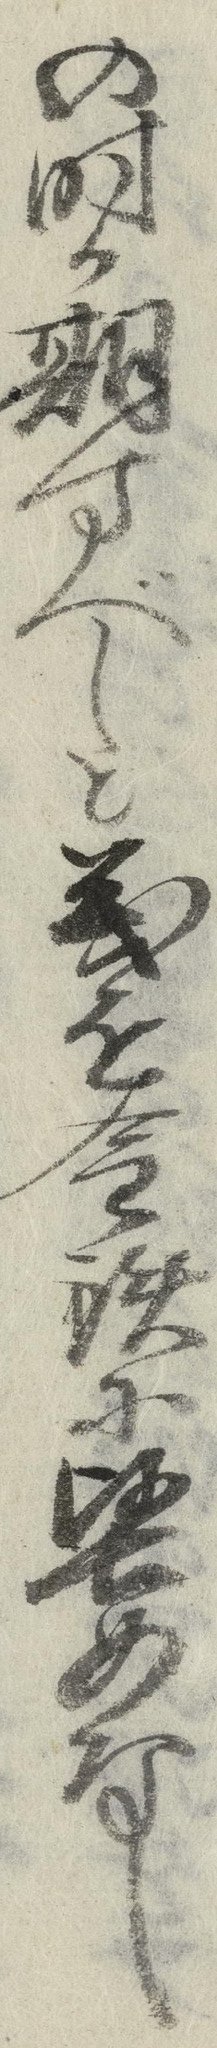の時か期すべしと義を金鉄に堅めなし
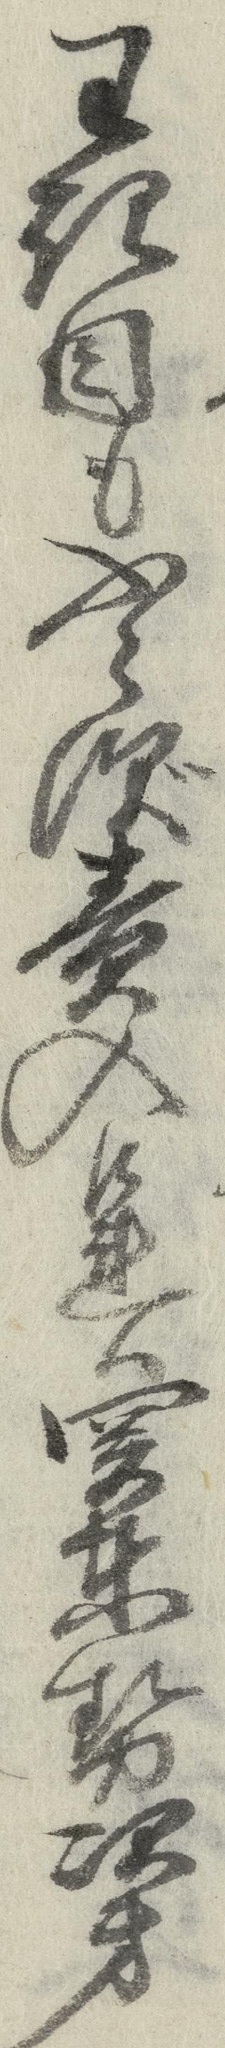わき目もふらず責入けれは関東勢次第
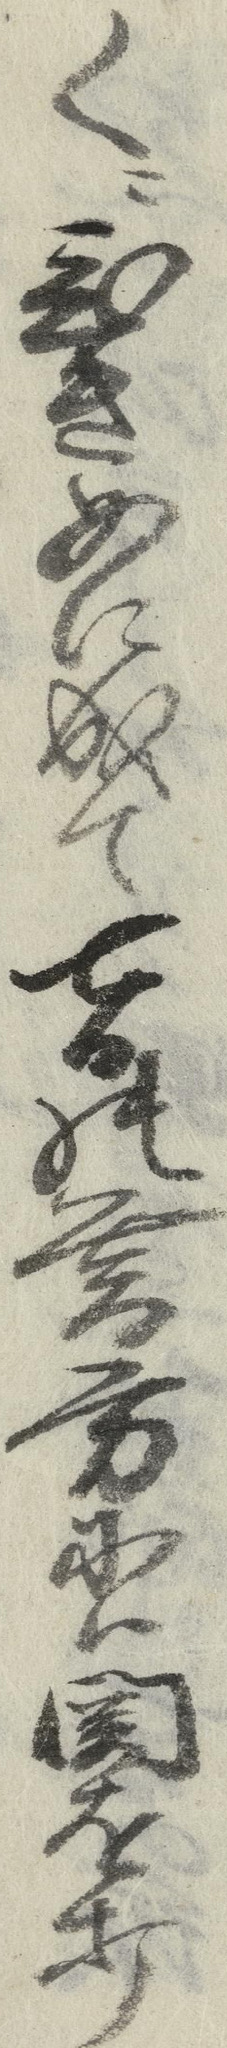〳〵にひきめに成て七日の暮方には関を打
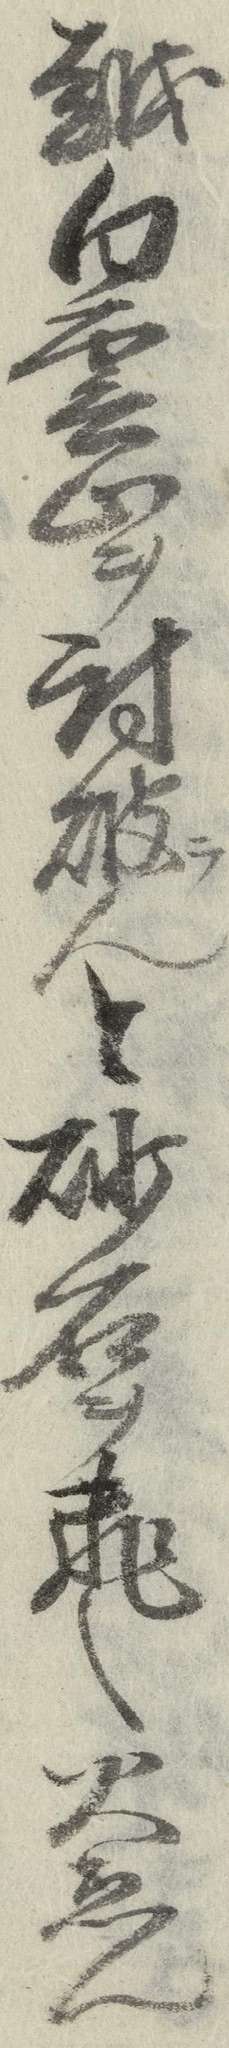越白雲山ヲ討破砂石飛し火ゑん
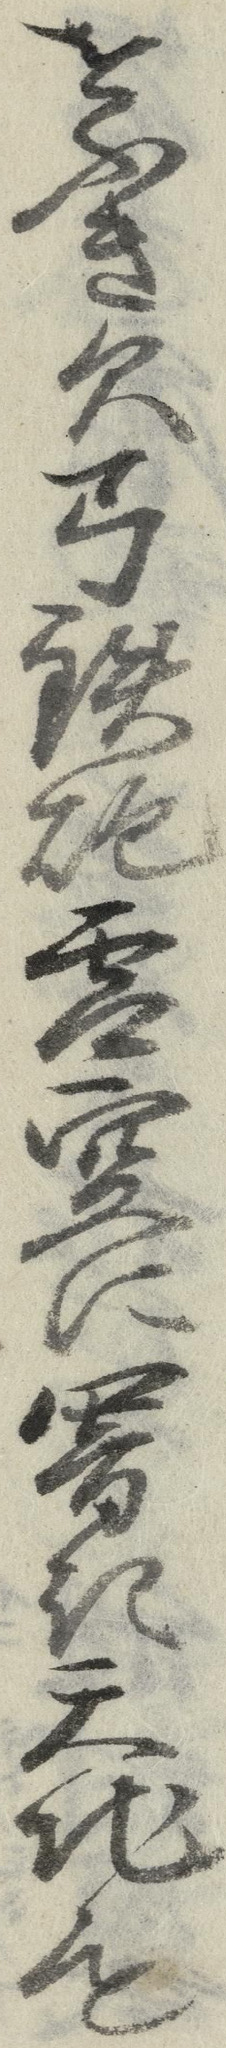をふき欠弓鉄炮雲空に響き天地を

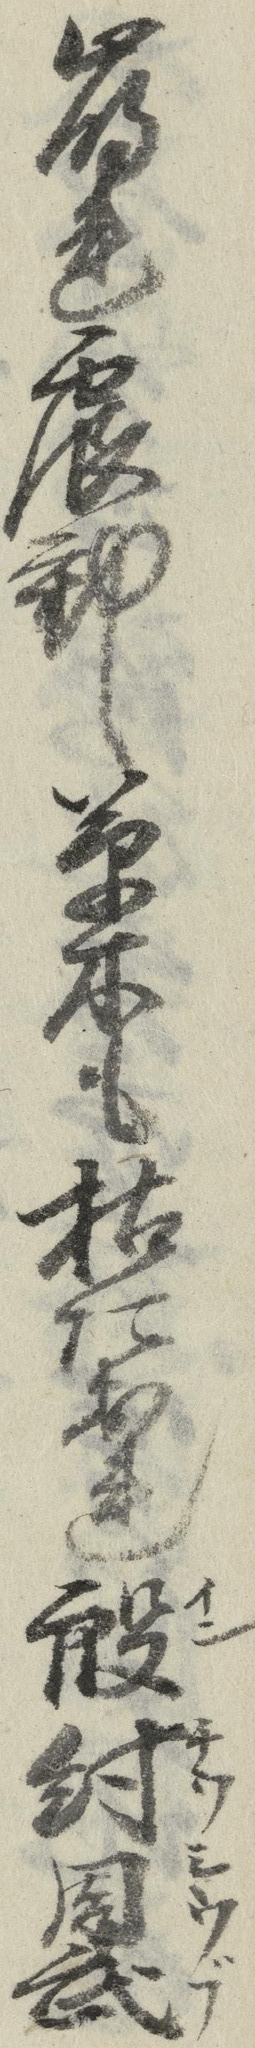崩れ震動し草木も枯たおれ殷紂周武
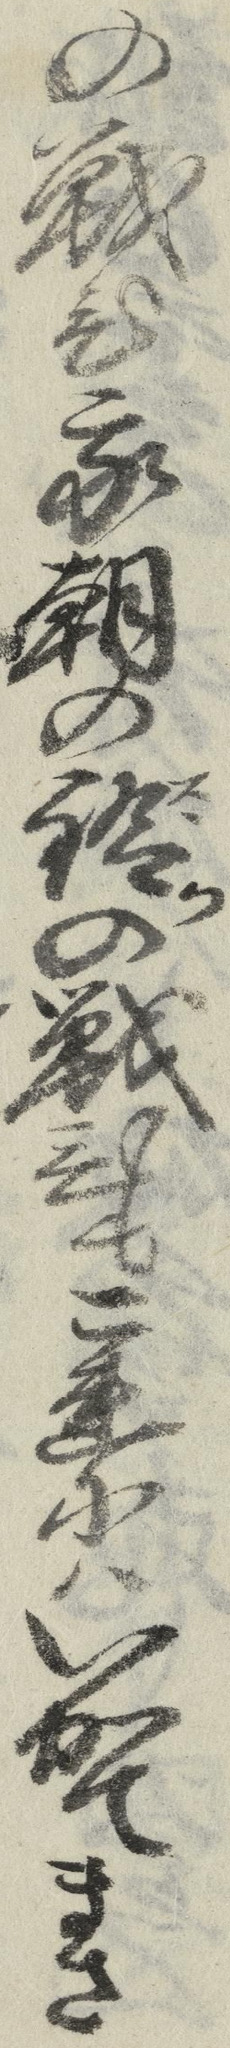の戦ひ我朝の鈴戦ひもこれにはいかてまさ
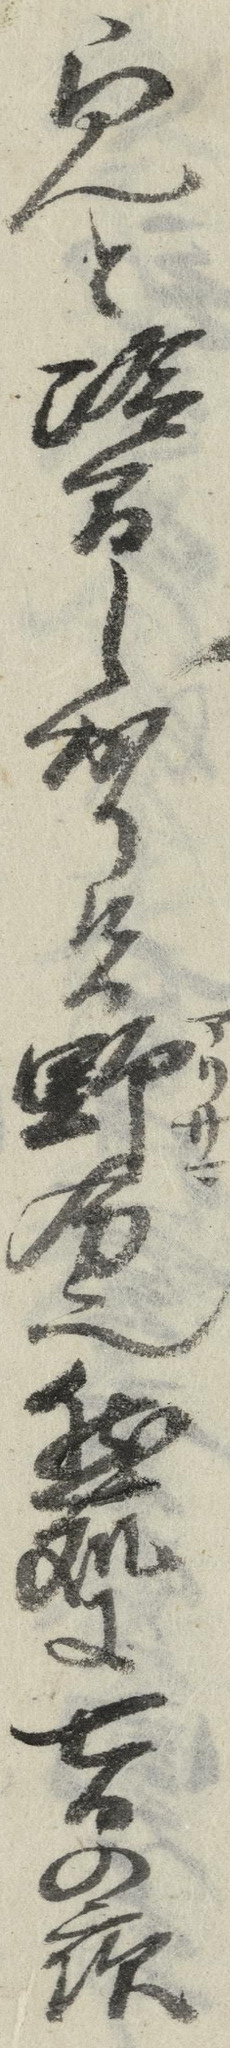らんと路間しかりける野分也然処に七日の夜
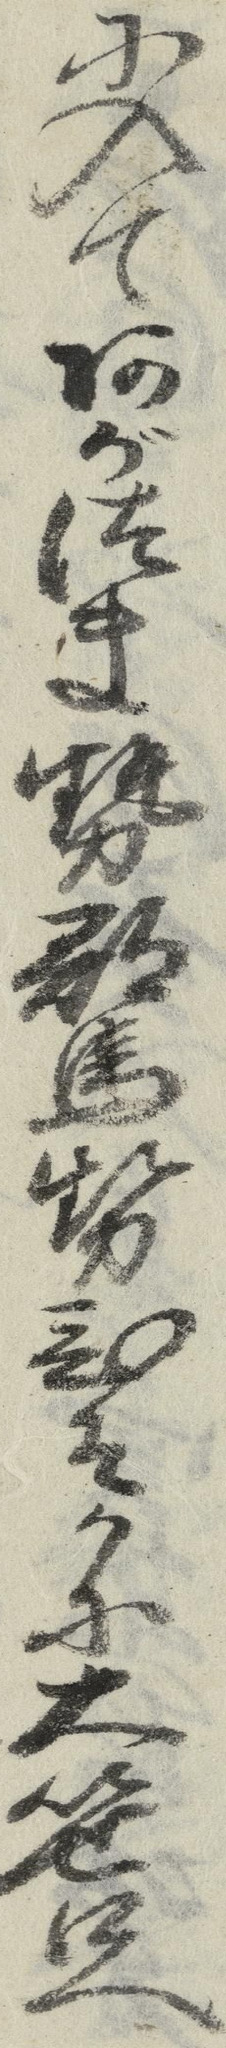に入てあがつま勢郡馬勢ひそかに大笹口へ
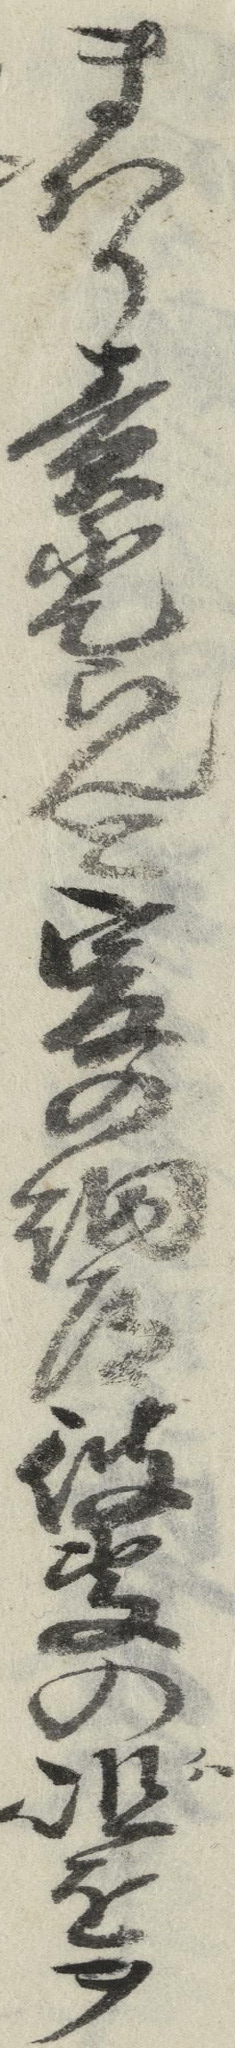まはり責登らんと爰の細道彼処の岨をヲ
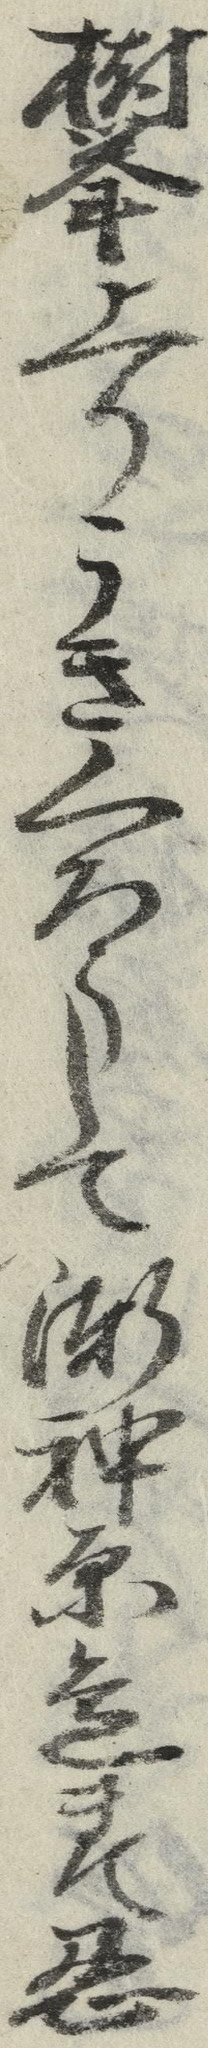攀上りうきくろうして漸神原辺まて忍
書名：浅間大焼騒動記　上
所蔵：東京大学地震研究所図書室 Earthquake Research Institute Library, The University of Tokyo, JAPAN
